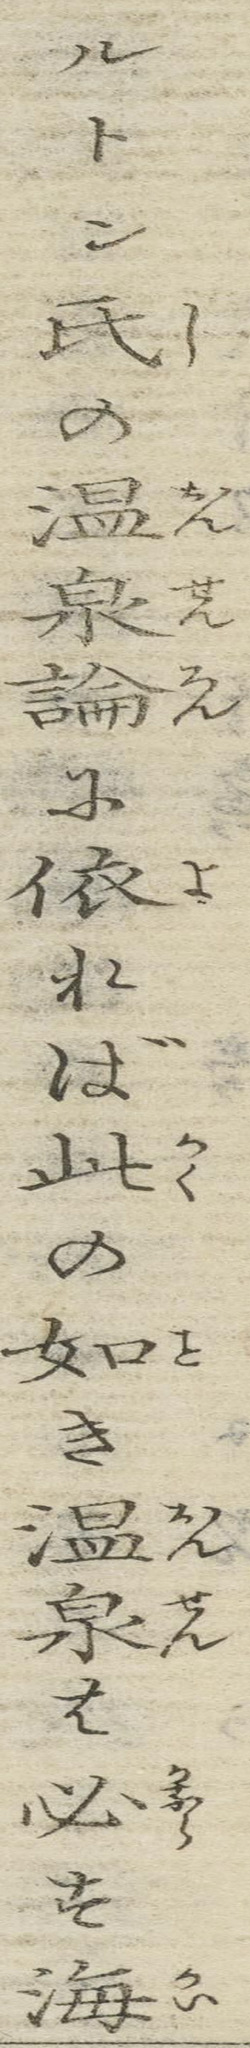ルトン氏の温泉論に依れば此の如き温泉は必す海
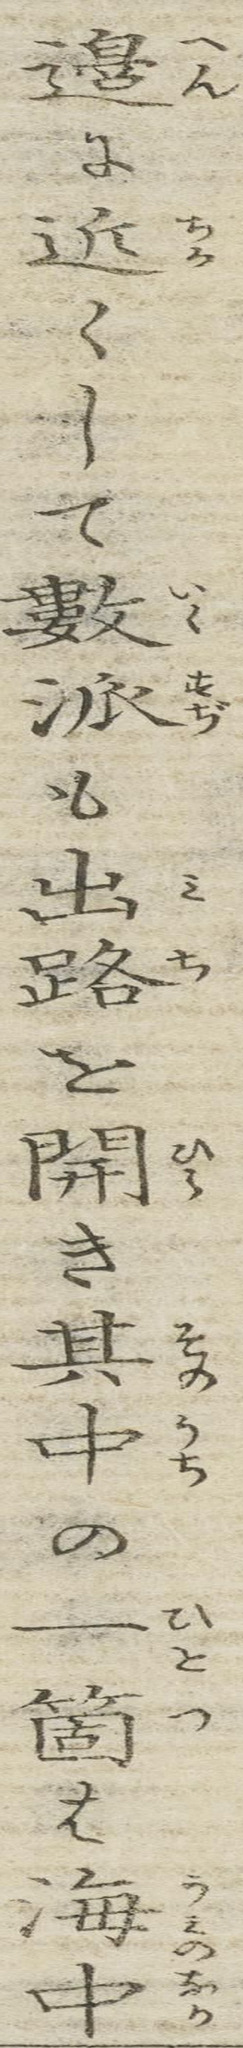辺に近くして数派も出路を開き其中の一箇は海中
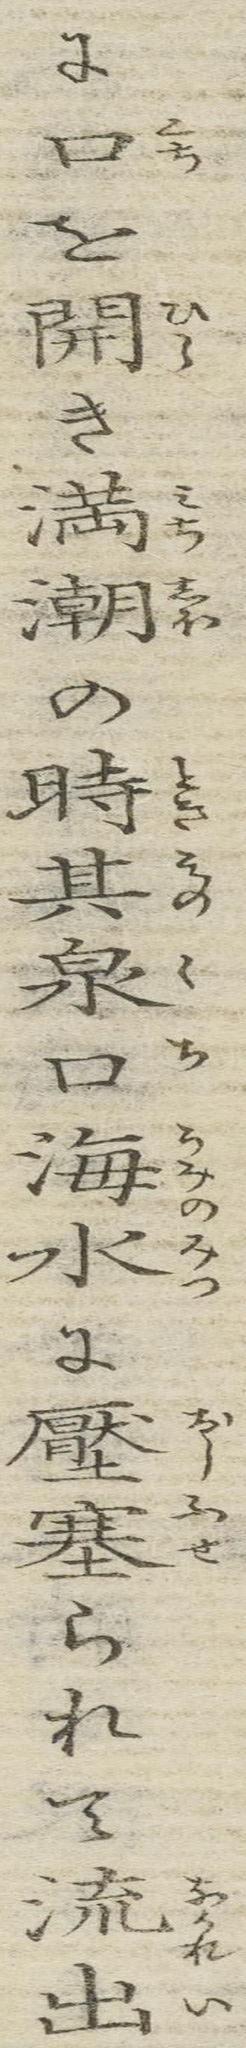に口を開き満潮の時其泉口海水に圧塞られて流出
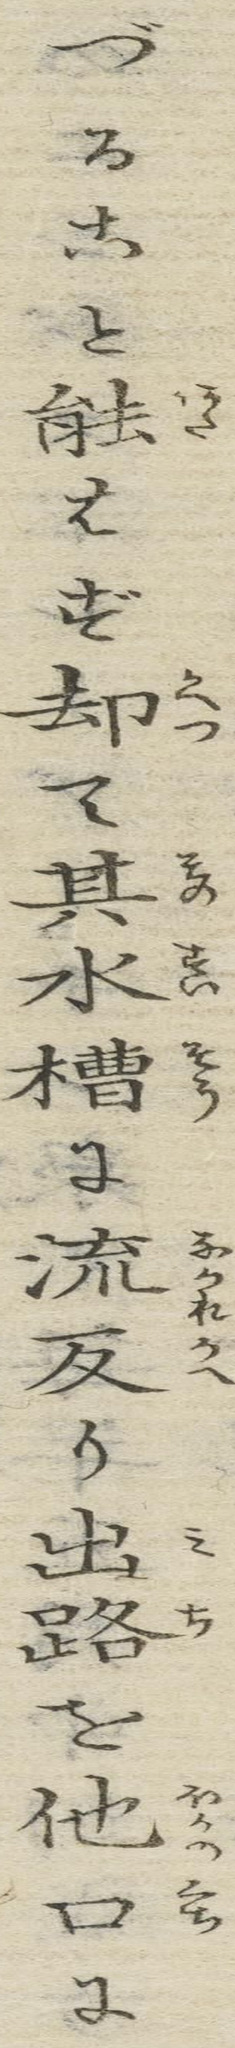づること能はず却て其水槽に流反り出路を他口に
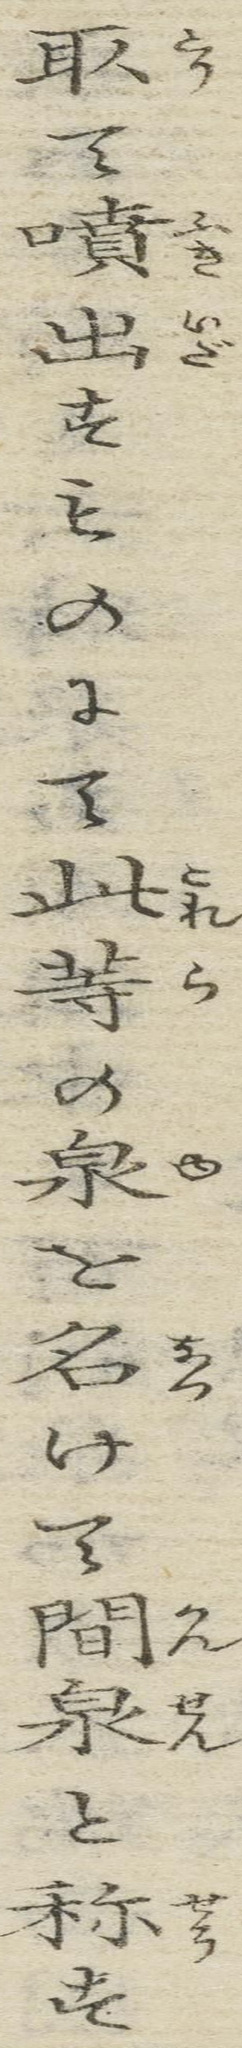取て噴出すものにて此等の泉を名けて間泉と称す
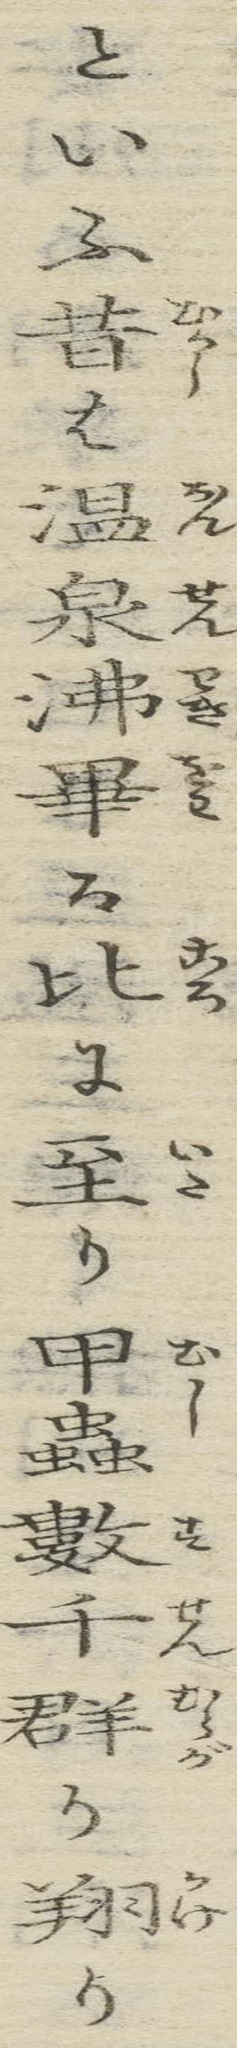といふ昔は温泉沸畢る比に至り甲虫数千群り翔り
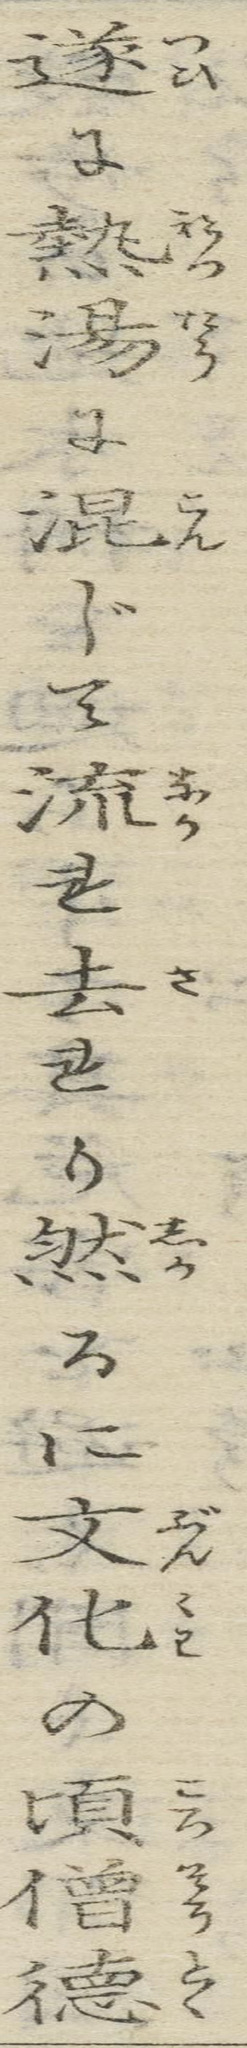遂に熱湯に混じて流れ去れり然るに文化の頃僧徳
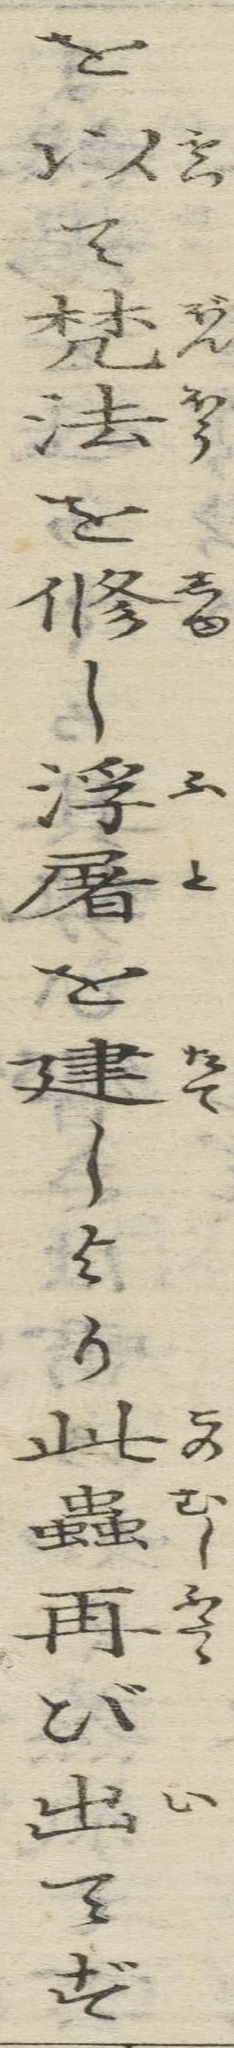を以て梵法を修し浮屠を建しより此虫再び出てず
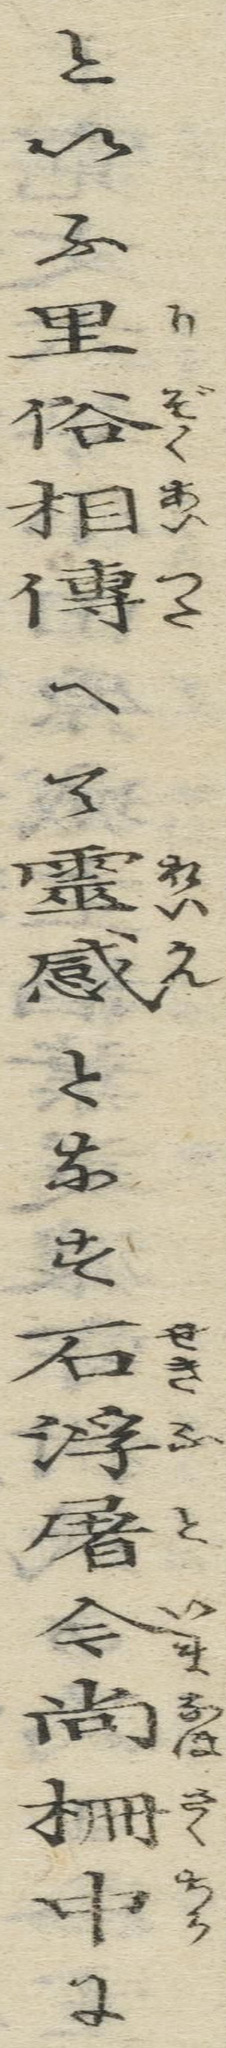といふ里俗相伝へて霊感となす石浮屠今尚柵中に
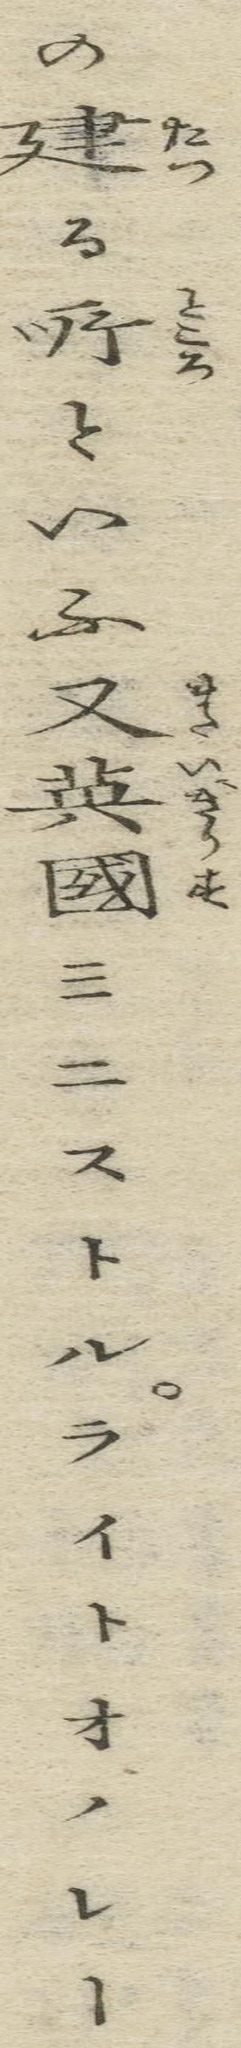の建る所といふ又英国ミニストル・ライトオノレー
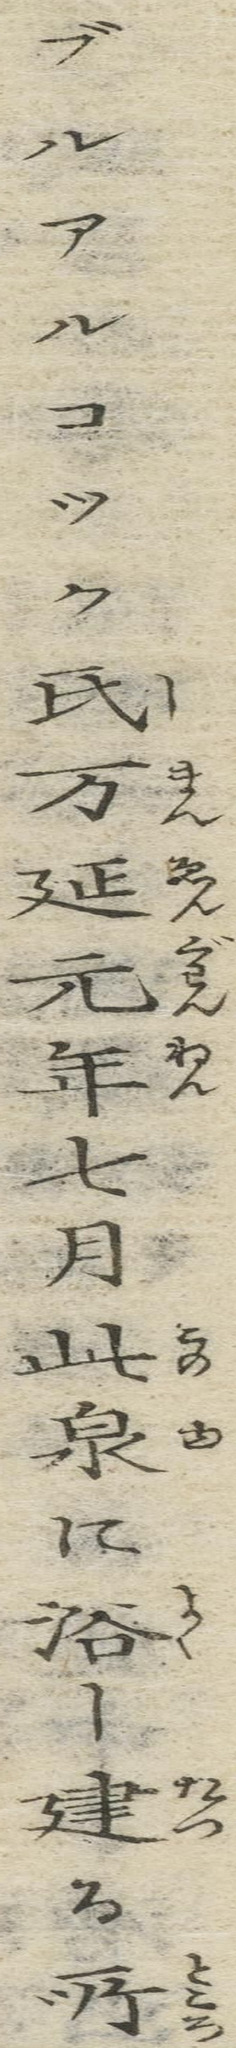ブルアルコツク氏万延元年七月此泉に浴し建る所
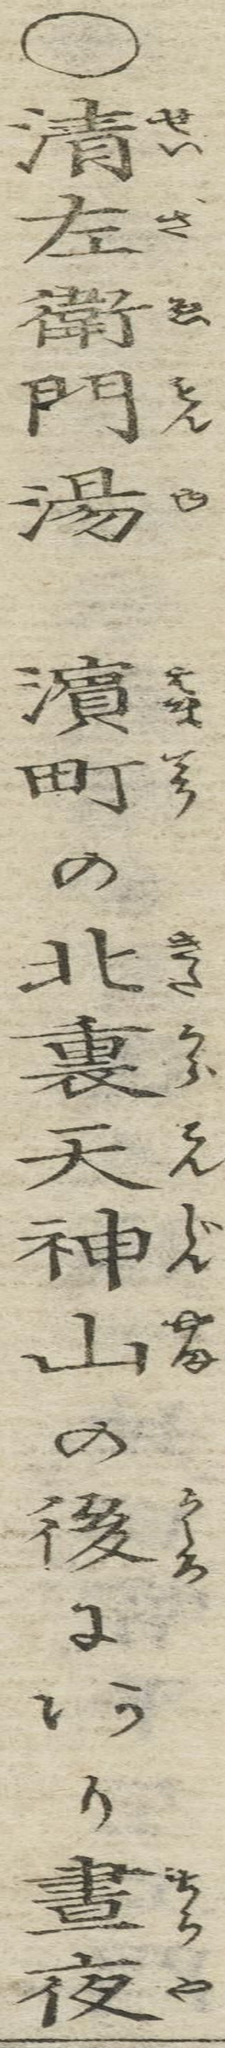○清左衛門湯浜町の北裏天神山の後にあり昼夜
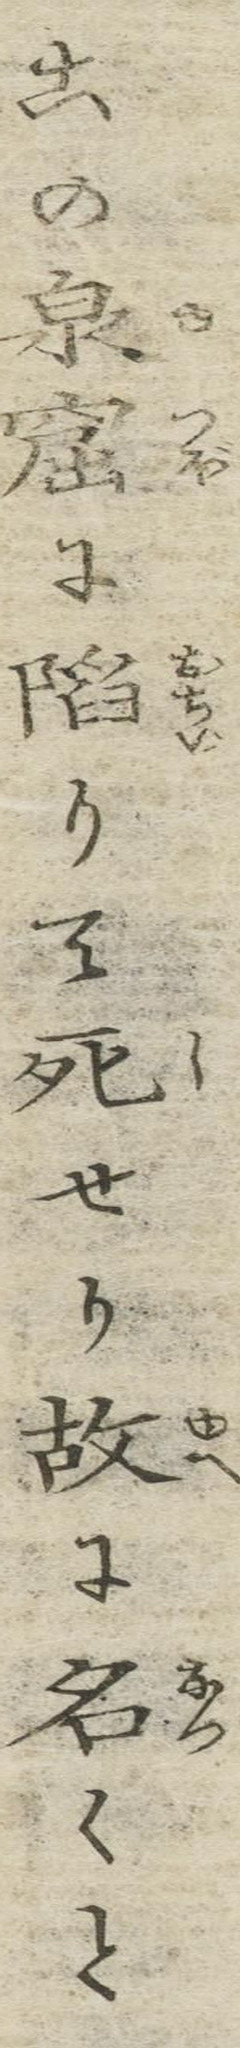この泉窟に陥りて死せり故に名くと
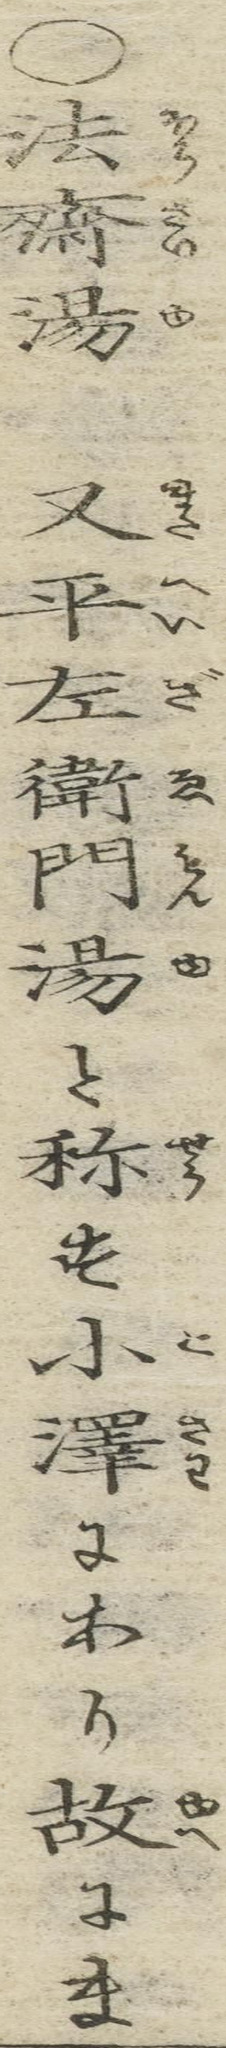○法斎湯又平左衛門湯と称す小沢にあり故にま

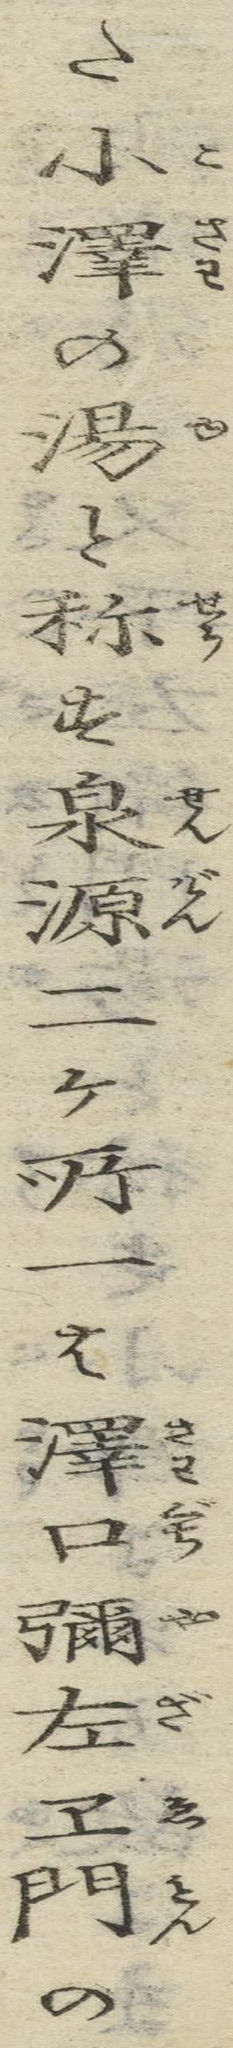た小沢の湯と称す泉源二ヶ所一は沢口弥左衛門の
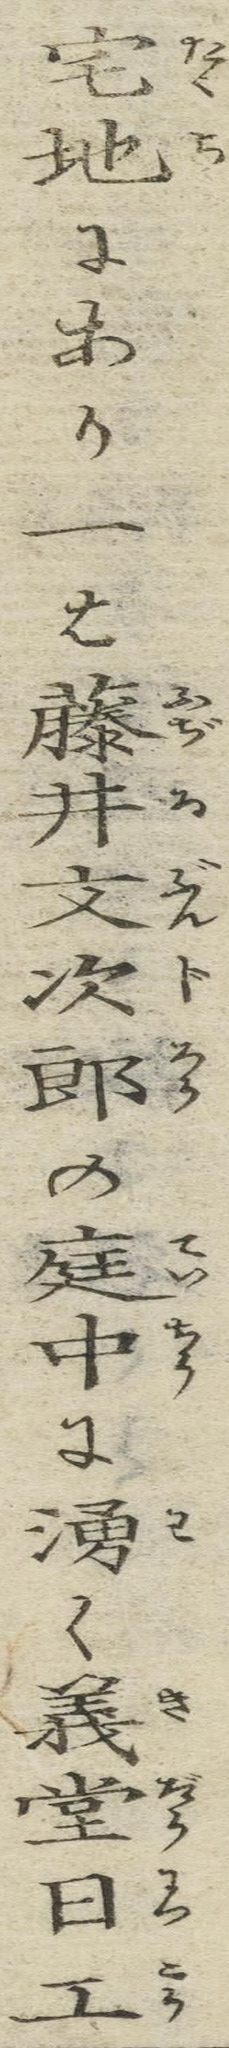宅地にあり一は藤井文次郎の庭中に湧く義堂日工
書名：豆州熱海誌　完
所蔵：東京大学地震研究所図書室 Earthquake Research Institute Library, The University of Tokyo, JAPAN
